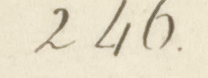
246
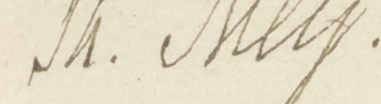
14. Meij.
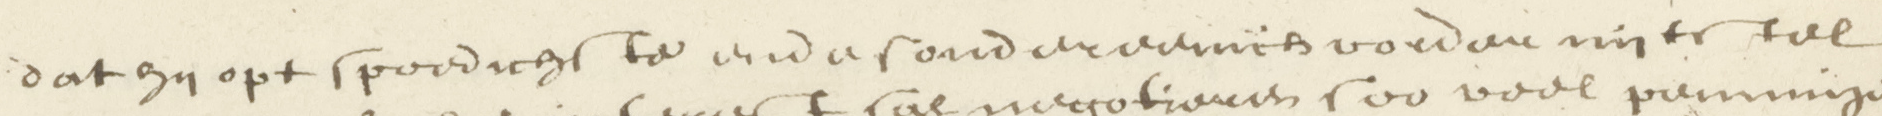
dat hy opt spoedichste ende sonder eenich vorder uytstel
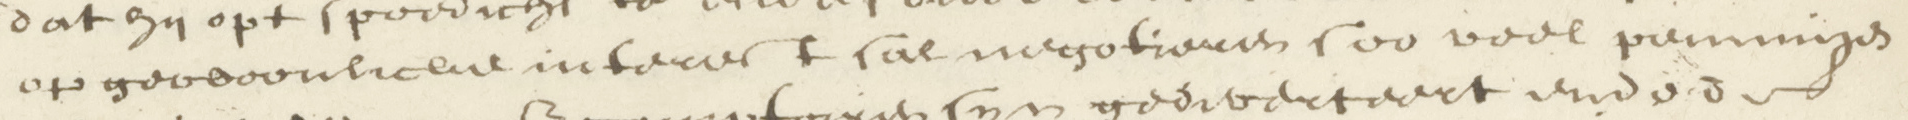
op gewoonlicke interest sal negotieren soo voel penningen
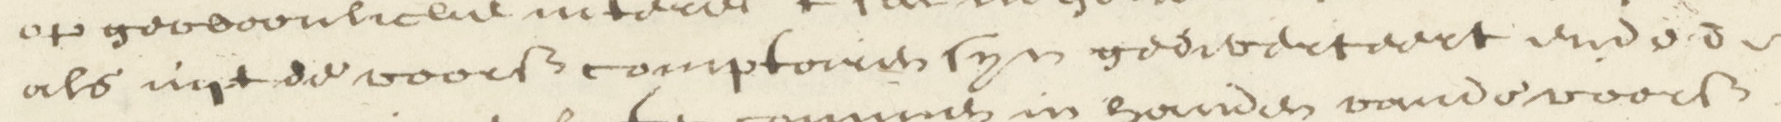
als uyt de voors comptoiren syn gediverteert ende de
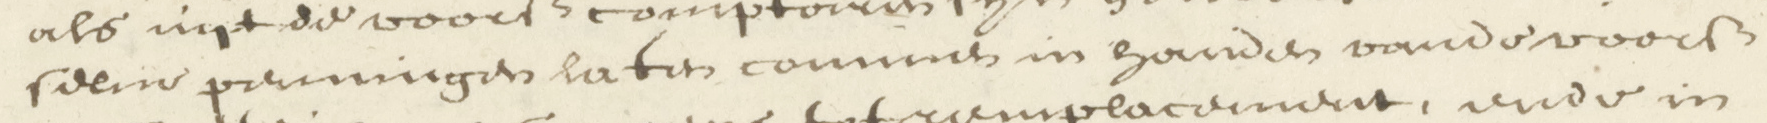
selue penningen laten commen in handen vande voors
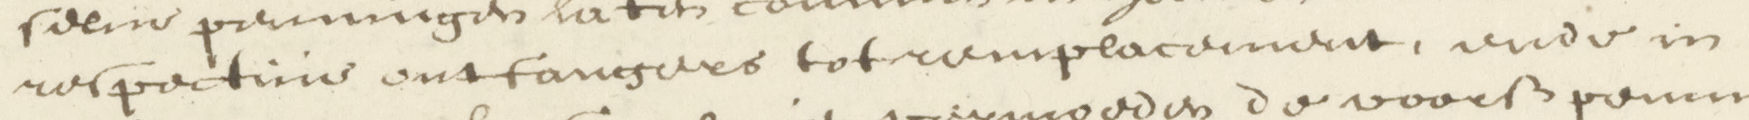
respectiue ontfangers tot remplacement, ende in
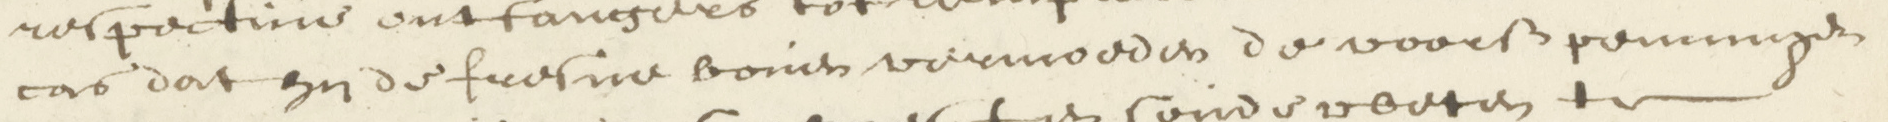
cas dat hy de fresne bouen vermoeden de voors penningen
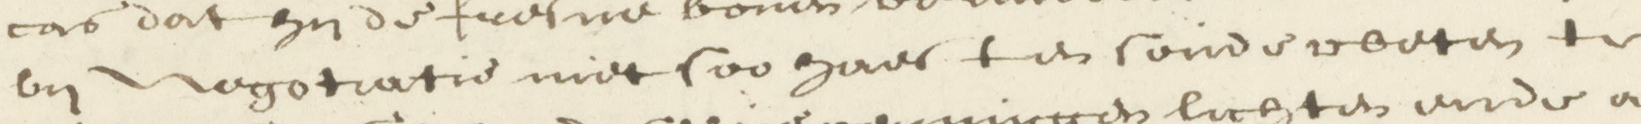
by Negotiatie niet soo haesten soude weten te
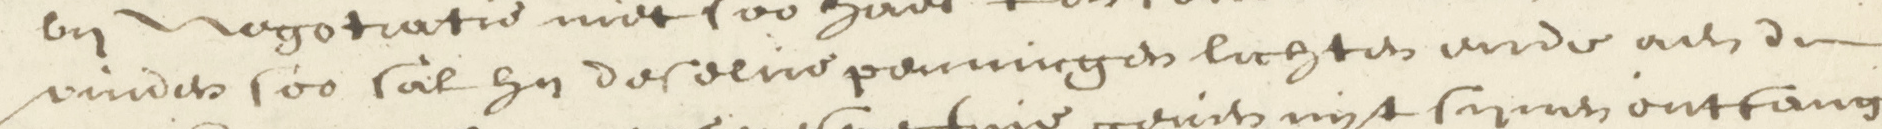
vinden soo sal hy deselve penningen lichten ende aen de
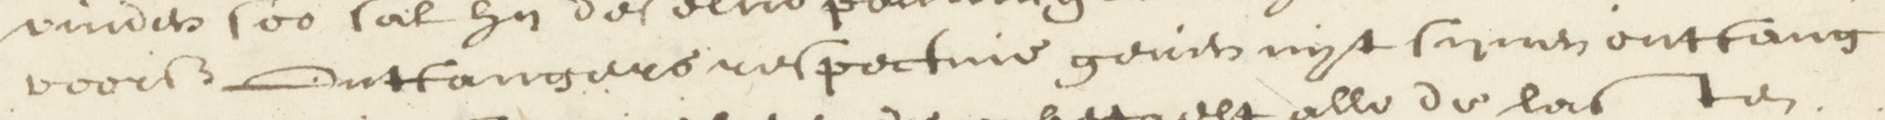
voors Ontfangers respectiue geuen uyt synen ontfang
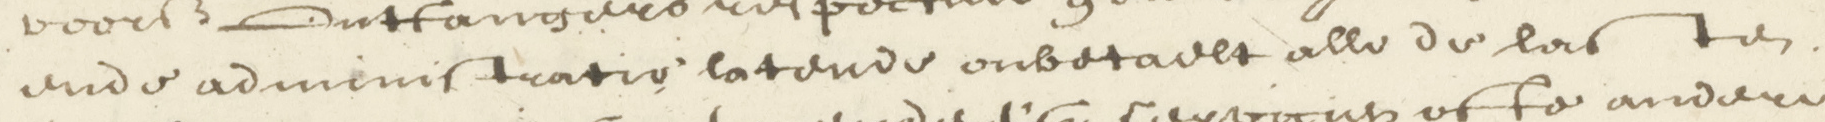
ende administratie latende onbetaelt alle de lasten
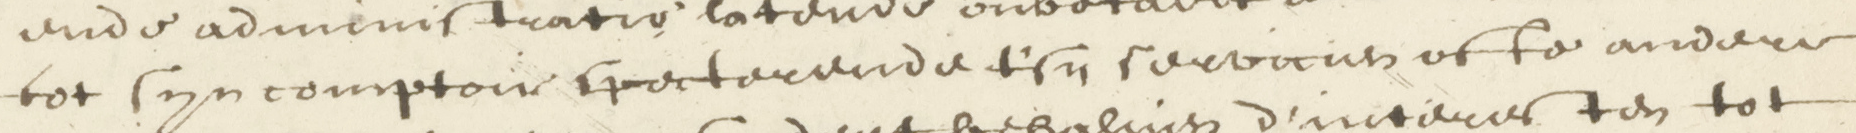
tot syn comptoir specterende tsy servocien ofte andere
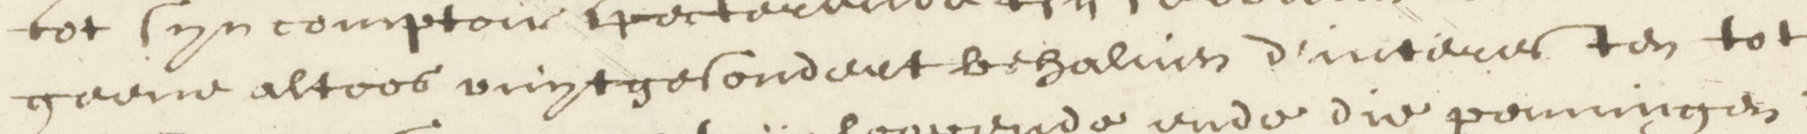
geene altoos vuytgesondert behaluen d'interesten tot
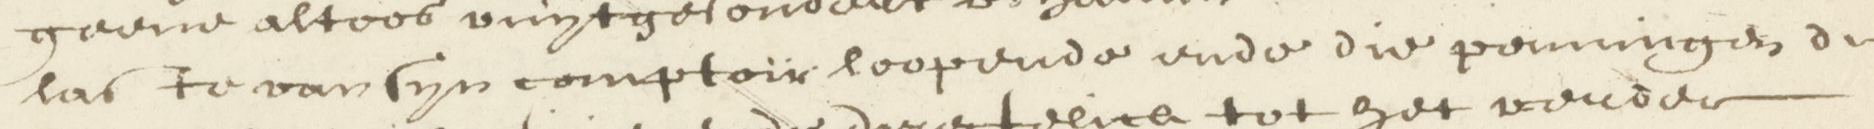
laste van syn comptoir loopende ende die penningen de
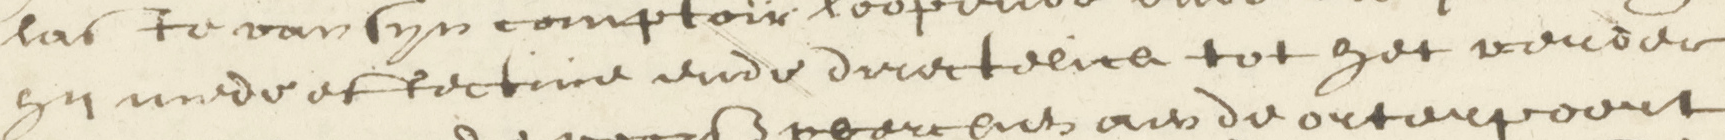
hy mede effectiue ende directelick tot het verder
